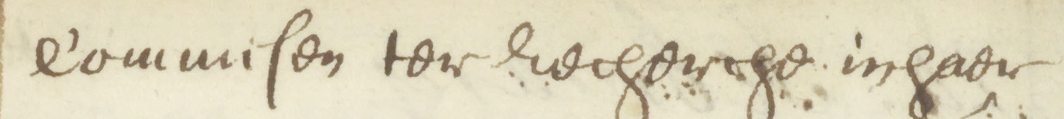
Commisen ter recherche in haer
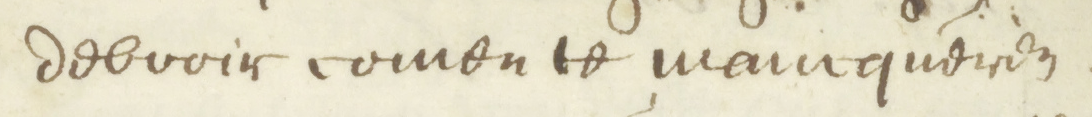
debvoir comen te mancqueren
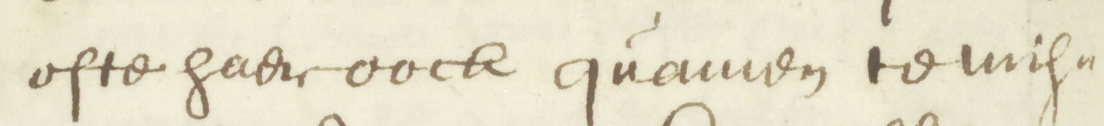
ofte haer oock quamen te mis„
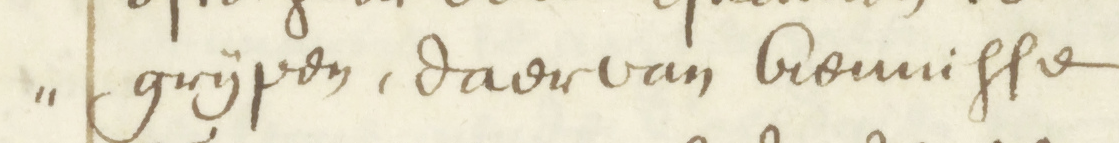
„grijpen, daervan kennisse
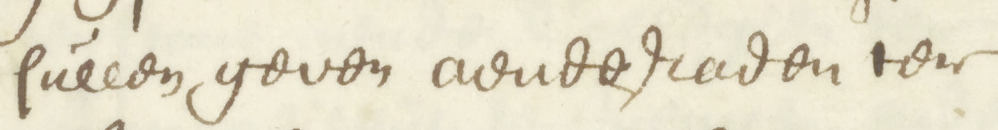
sullen geven aende raden ter
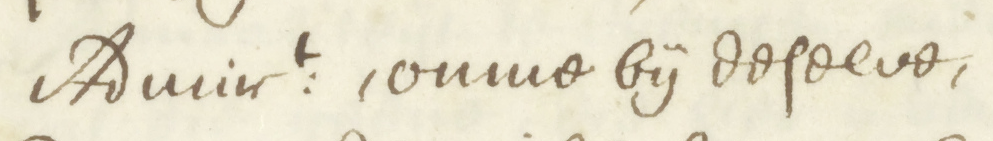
Admirt:, omme bij deselve,
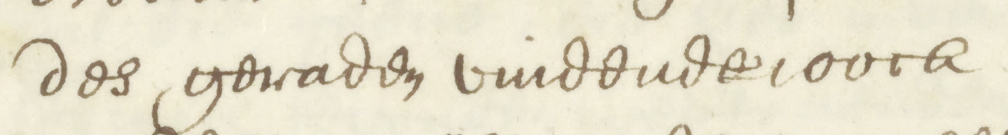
des geraden vindende, oock
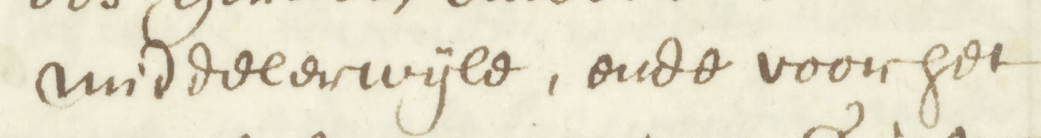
middelerwijle, ende voor het
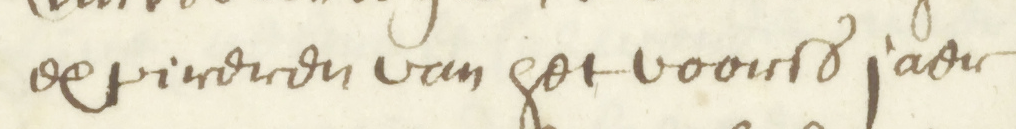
expireren van het voors jaer
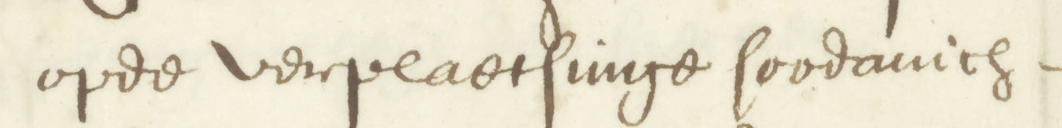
opde verplaetsinge soodanich
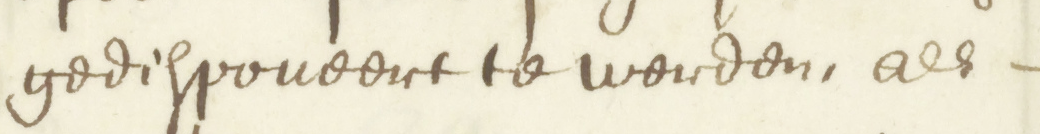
gedisponeert te werden, als
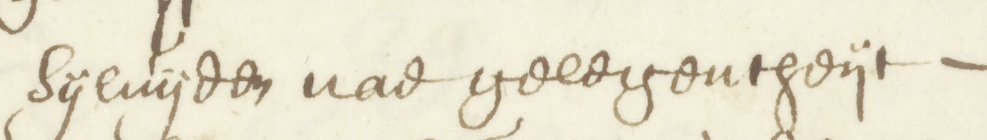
sijluijden nae gelegentheijt
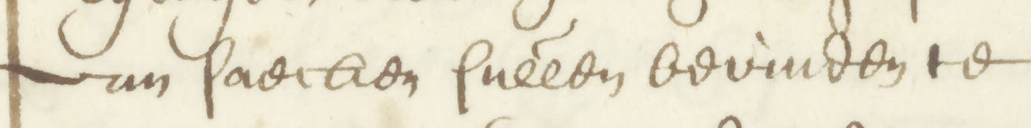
van saecken sullen bevinden te
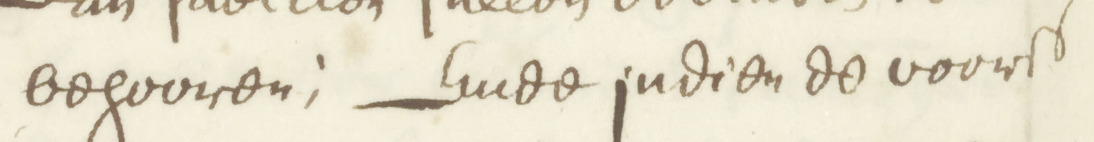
behooren; Ende indien de voors
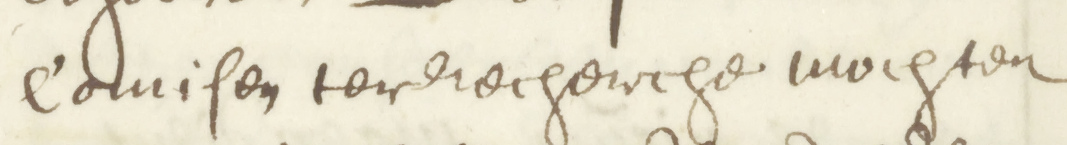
Comisen ter recherche mochten
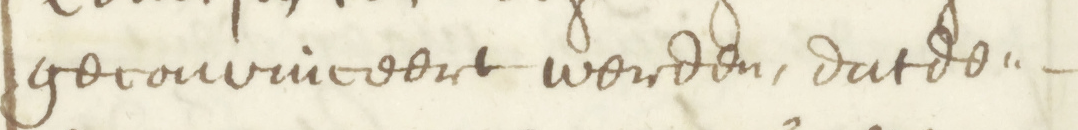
geconvinceert werden, dat de„ -
